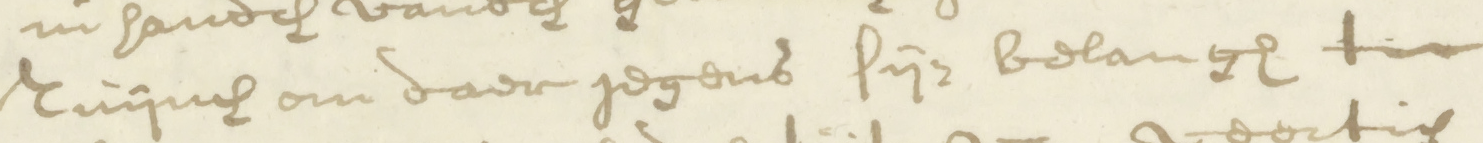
Ruijnen om daer jegens sijn belangh te
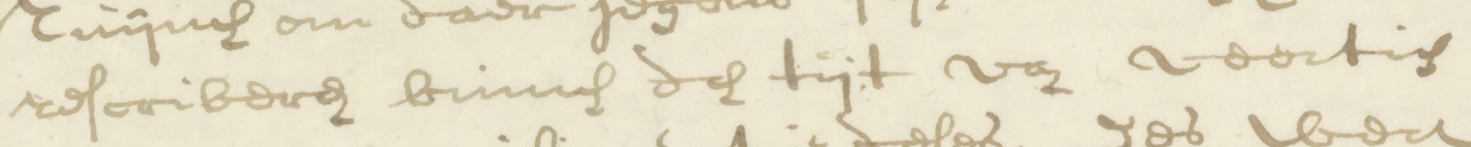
rescriberen binnen den tijt van veertien
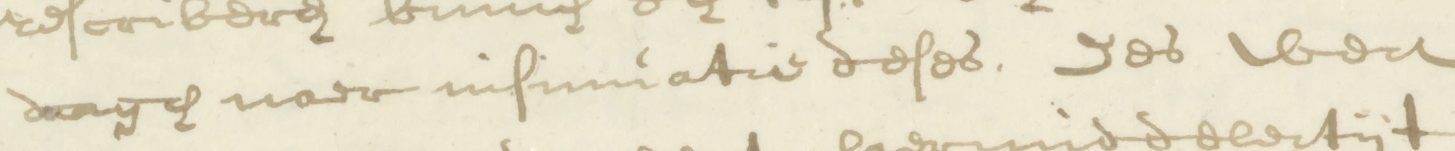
dagen naer insinuatie deses. Des wert
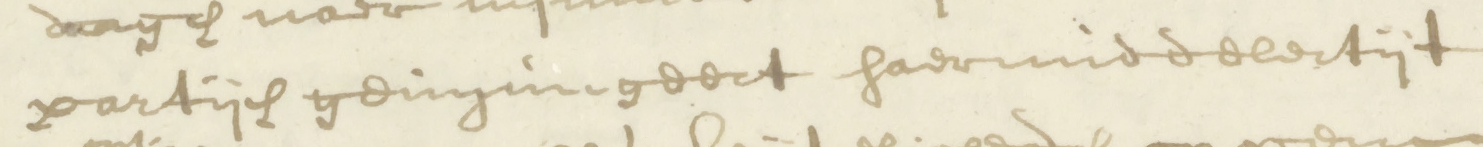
partijen geinjungeert haer middelertijt
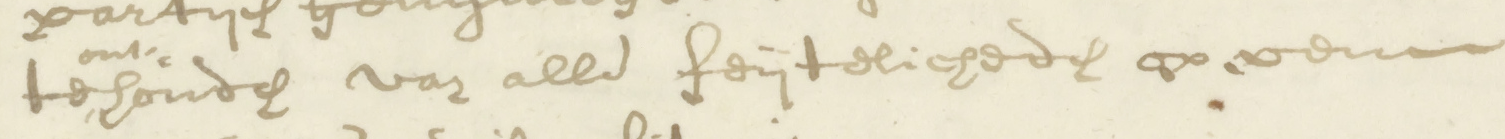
te onthouden van alle feijtelicheden op pene
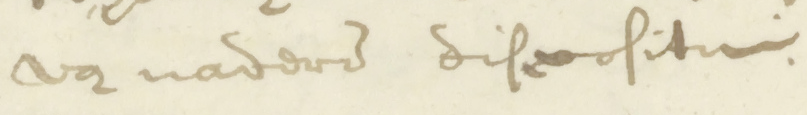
van nadere dispositie.
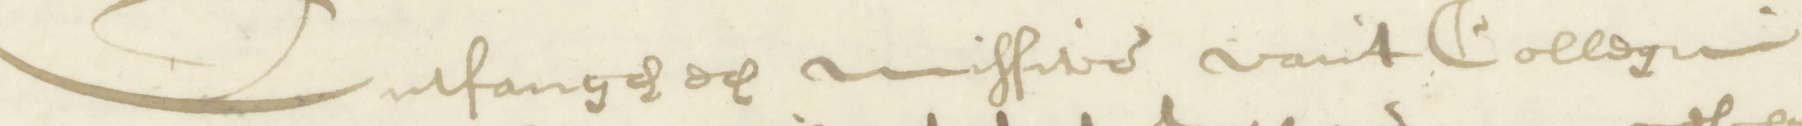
Onfangen de missive van‛t Collegie
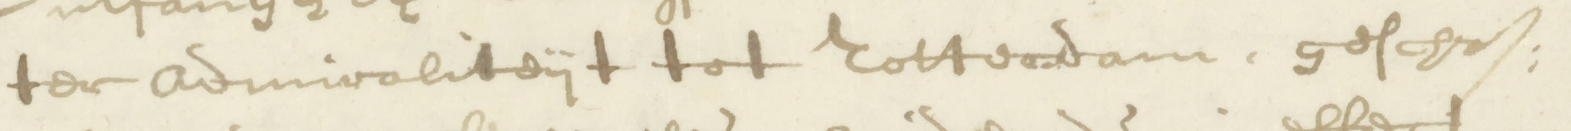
ter Admiraliteijt tot Rotterdam, geschr:
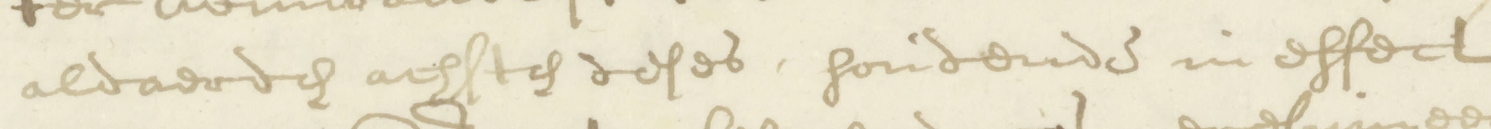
aldaer den achsten deses, houdende in effect
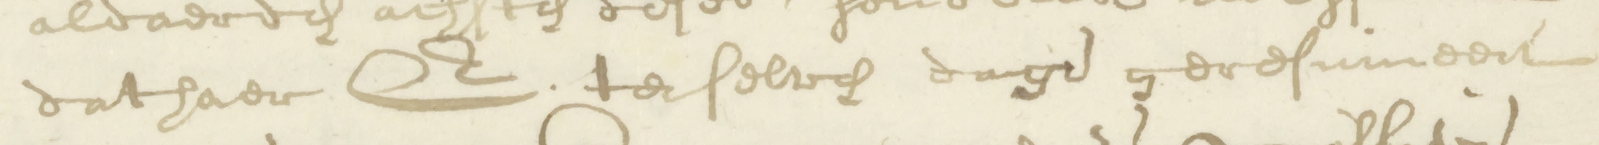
dat haer E. terselven dage geresumeert
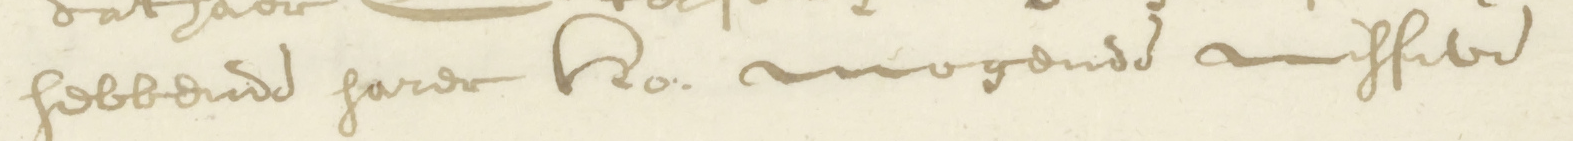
hebbende harer Ho:Mogende Missive
